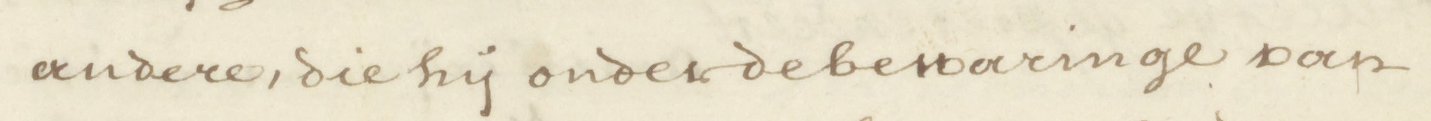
andere, die hij onder de bewaringe van
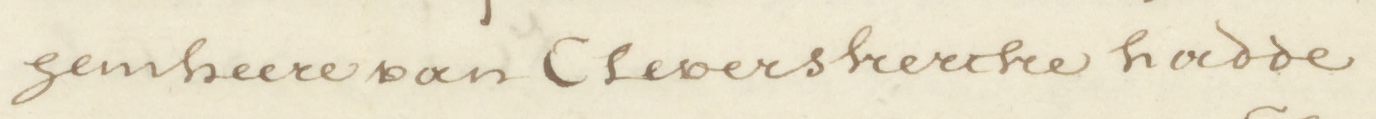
hem heere van Cleverskercke hadde
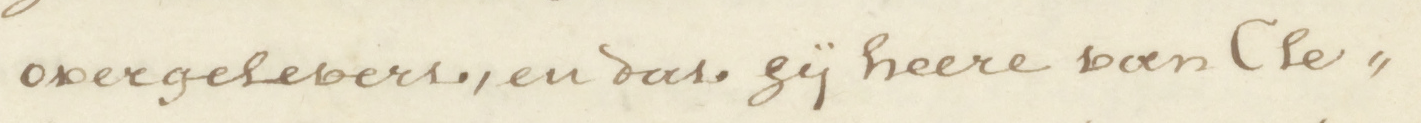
overgelevert, en dat hij heere van Cle„
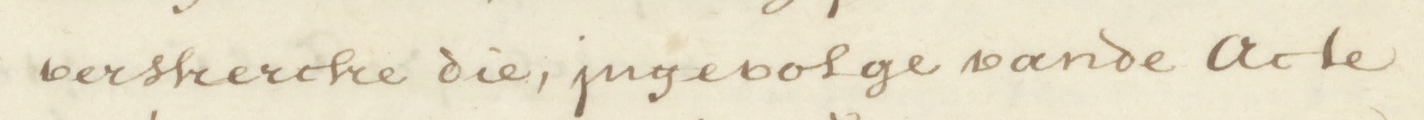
verskercke die, ingevolge vande Acte
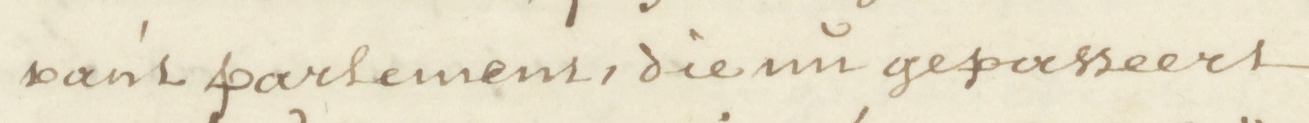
van 't parlement, die nu gepasseert
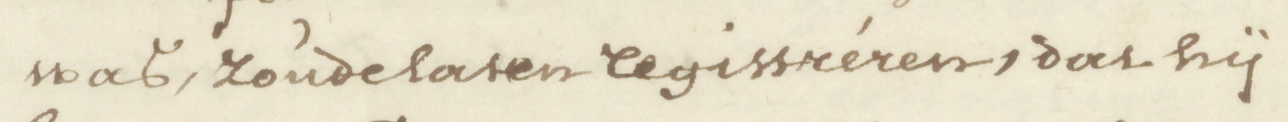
was, zoude laten registreren, dat hij
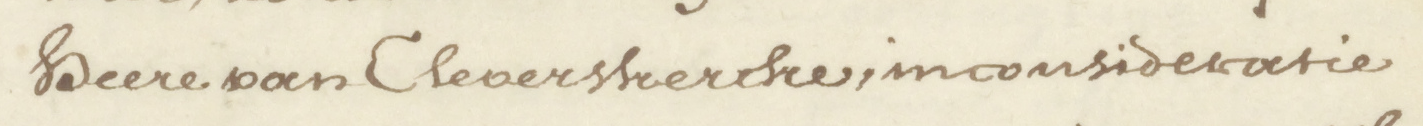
Heere van Cleverskercke, in consideratie
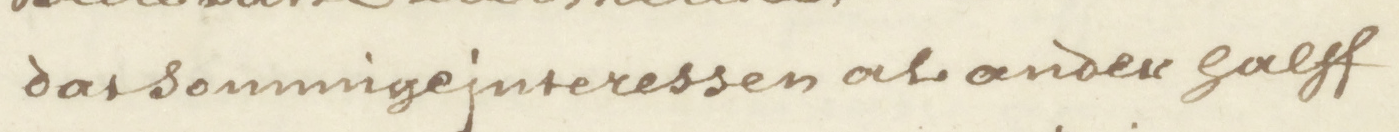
dat sommige interessen al ander halff
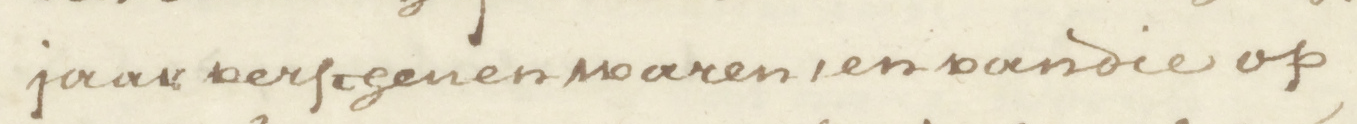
jaar verschenen waren, en vandie op
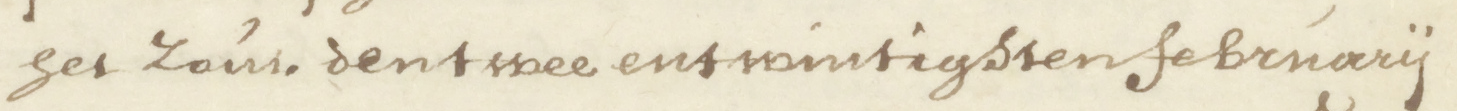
het zout den tweeentwintigsten februarij
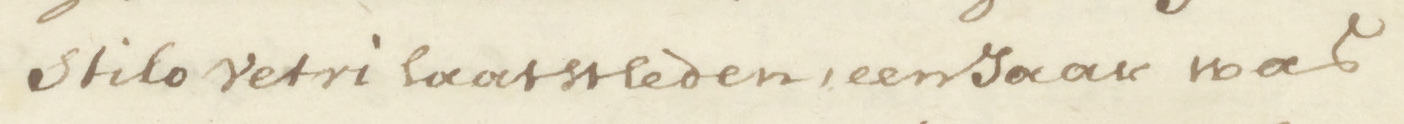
stilo vetri laatstleden, een jaar was
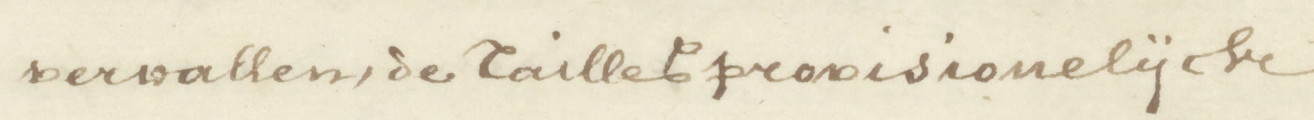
vervallen, de Tailles provisionelijck
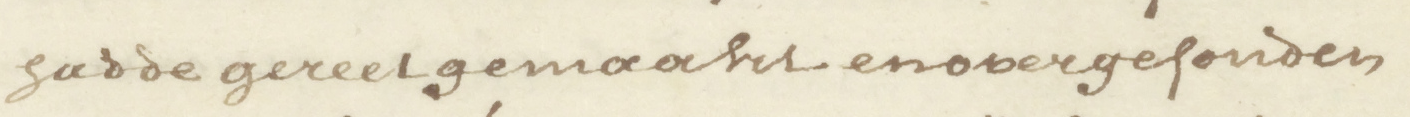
hadde gereet gemaakt en overgesonden
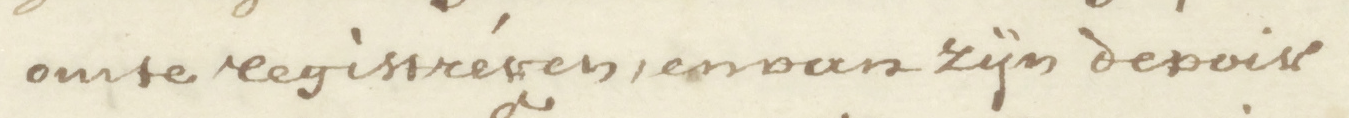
om te registreren, en van zijn devoir
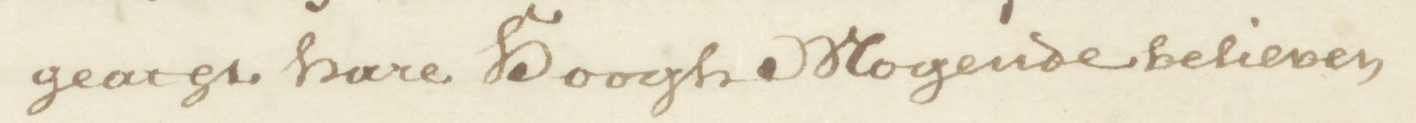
geacht hare Hoogh Mogende believen
